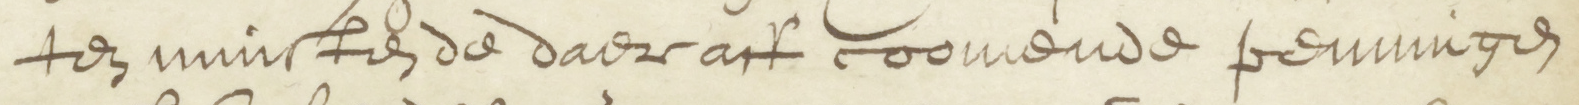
ten minsten de daer aff coomende penningen
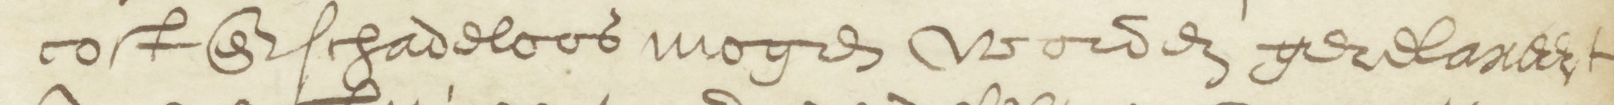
cost & schadeloos mogen worden gerelaxeert
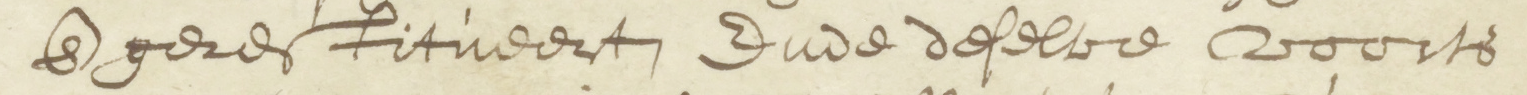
& gerestitueert, Ende deselve voorts
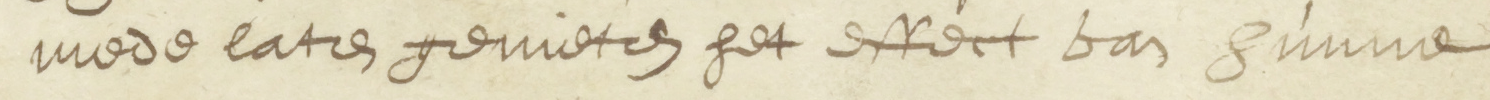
mede laten genieten het effect van hunne
